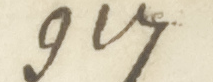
917
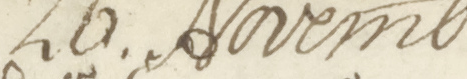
26. Novemb:
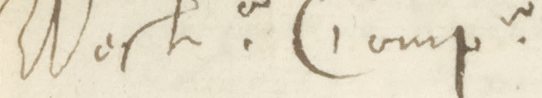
Weste Compe.
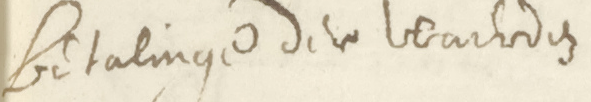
betalinge der waerden
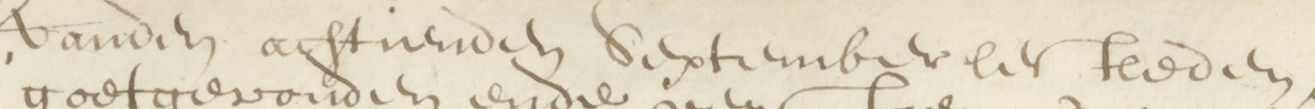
vanden achtienden September lestleden,
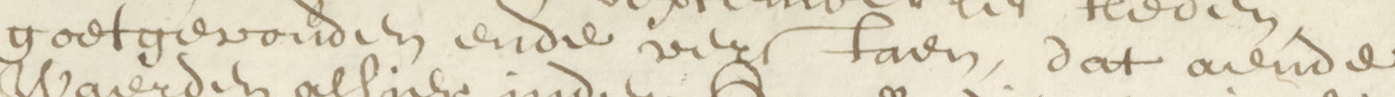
goetgevonden ende verstaen, dat aende
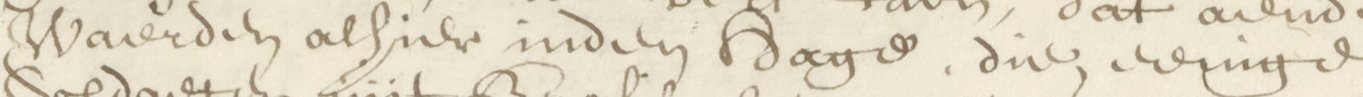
Waerden alhier inden Hage, die eenige
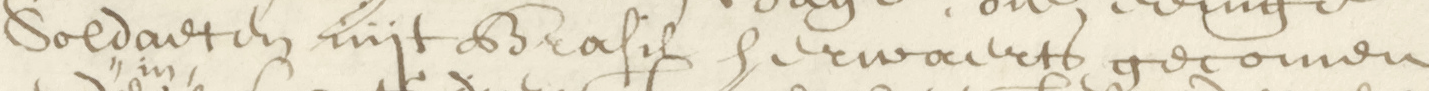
Soldaeten uijt Brasil herwaerts gecomen
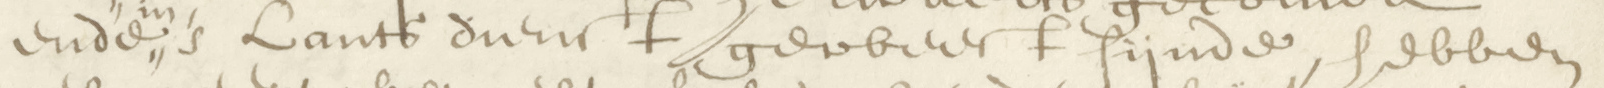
ende#in 's Lants dienst geweest sijnde, hebben
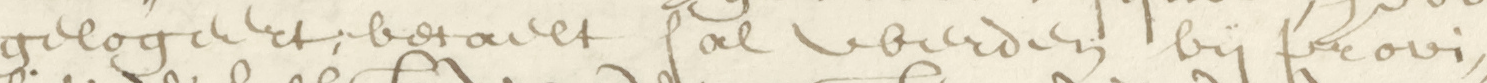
gelogeert, betaelt sal werden bij provi„
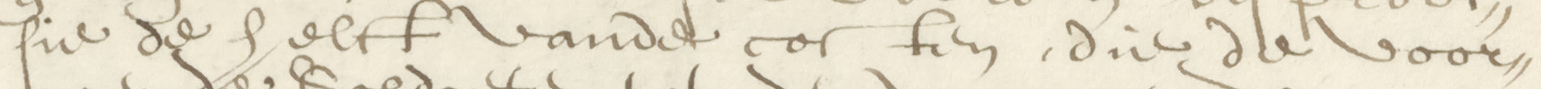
sie de helft vande costen, die de voor„
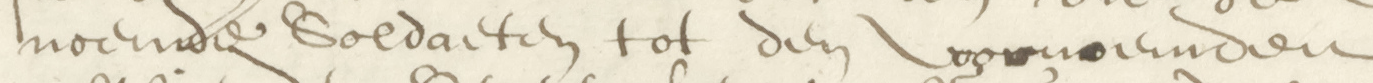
noemde Soldaeten tot den voornoemden
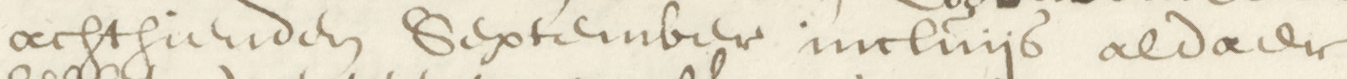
achthienden September incluijs aldaer
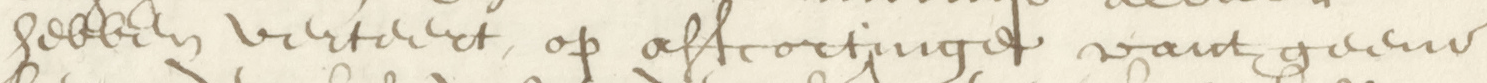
hebben verteert, op affcortinge vant geene
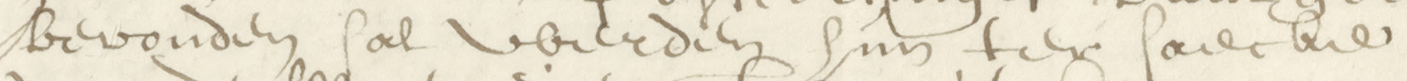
bevonden sal werden hun ter saecke
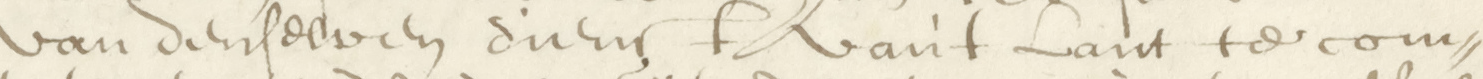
van denselven dienst van‛t Lant te com„,
